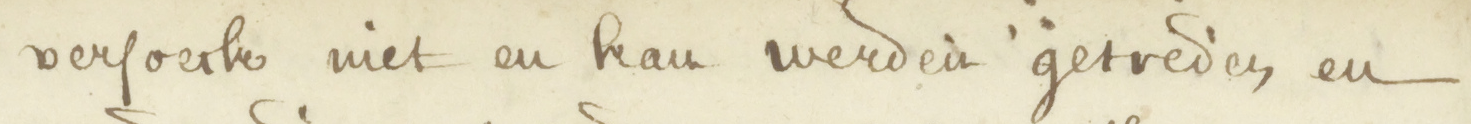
versoeck niet en kan werden getreden en
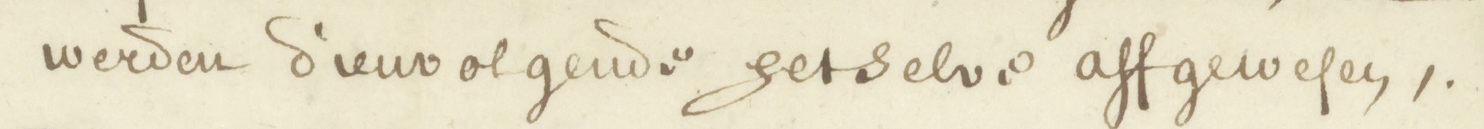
werden dienvolgende hetselve affgewesen.
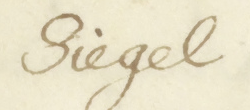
Siegel
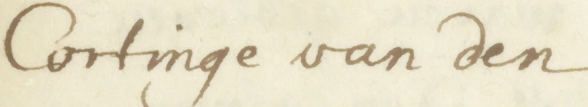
Cortinge van den
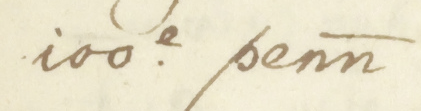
100e. penn
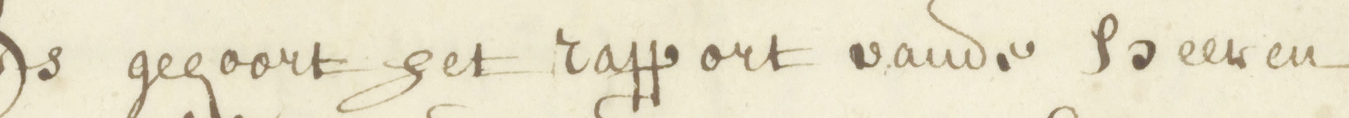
Is gehoort het rapport vande Heeren
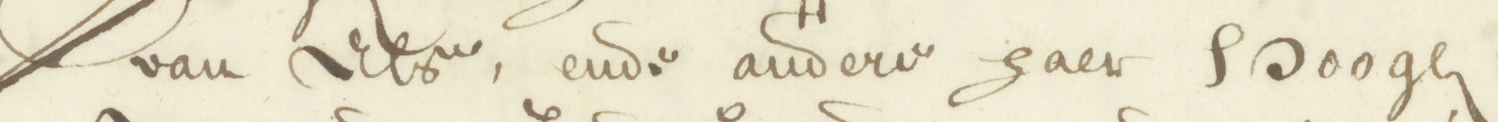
van Els, ende andere haer Hoogh
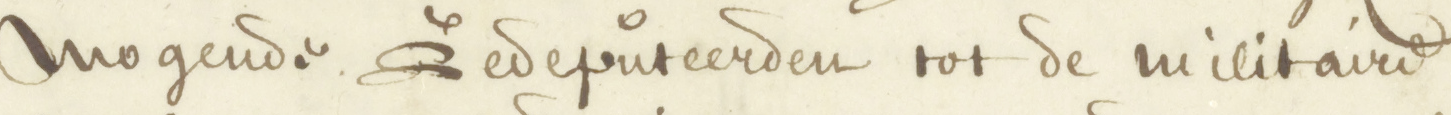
Mogende Gedeputeerden tot de militaire
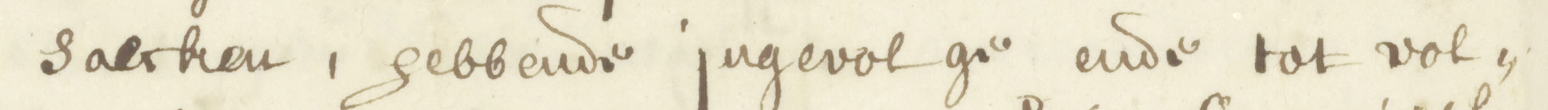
saecken, hebbende ingevolge ende tot vol„
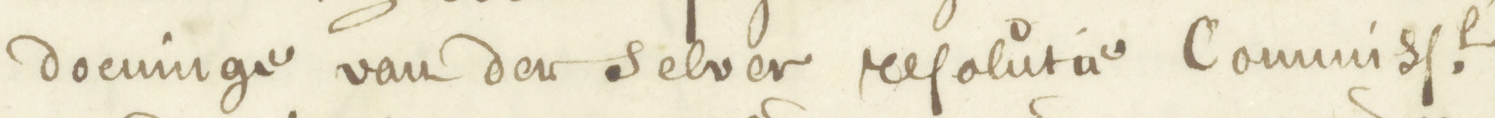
„doeninge van der selver resolutie Commissl.
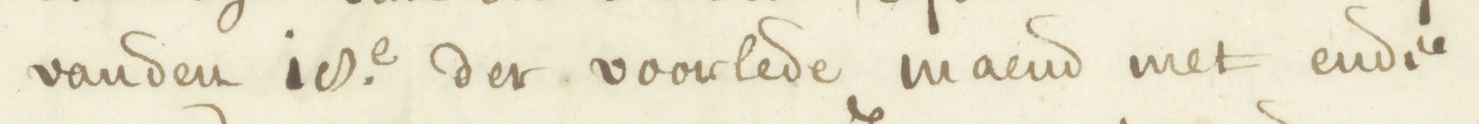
vanden 18e. der voorlede maend met ende
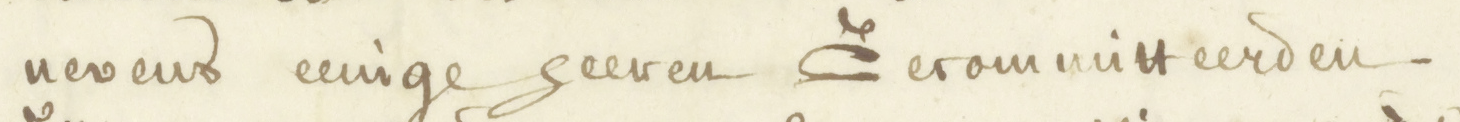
nevens eenige heeren Gecommitteerden
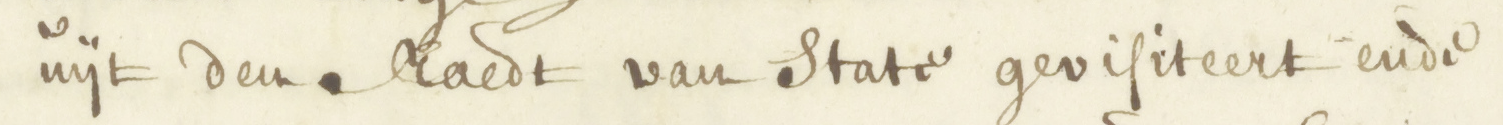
uijt den Raedt van State gevisiteert ende
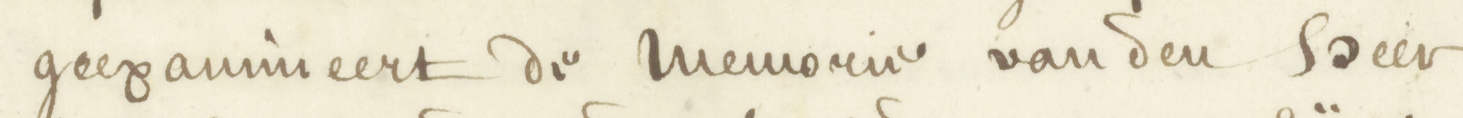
geexamineert de memorie vanden Heer
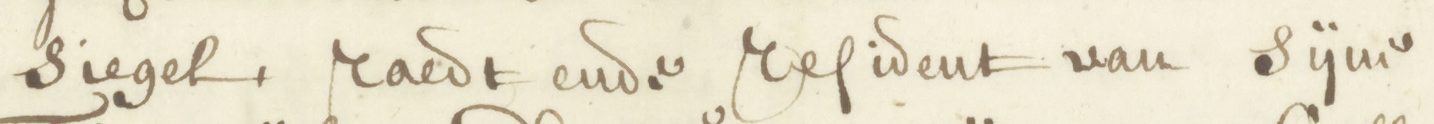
Siegel, raedt ende resident van sijne
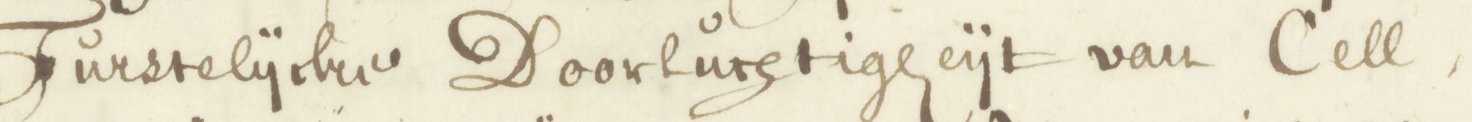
Furstelijcke Doorluchtigheijt van Cell,
